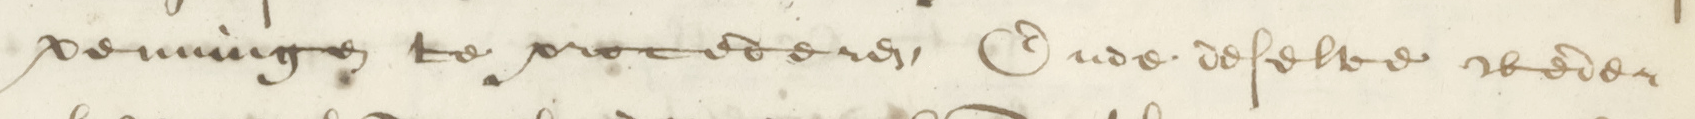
penningen te procederen, Ende deselve weder
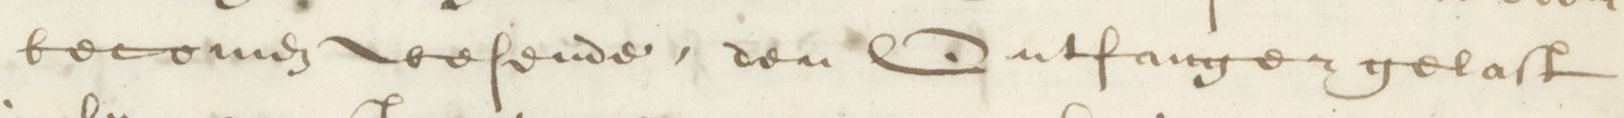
becomen wesende, den Ontfanger gelast
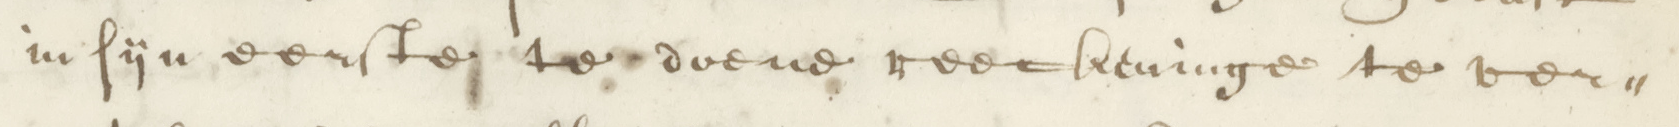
in sijn eerste te doene reeckeninge te ver„
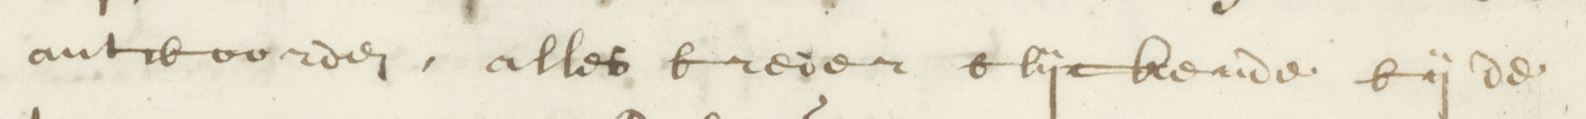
antwoorden, alles breder blijckende bij de
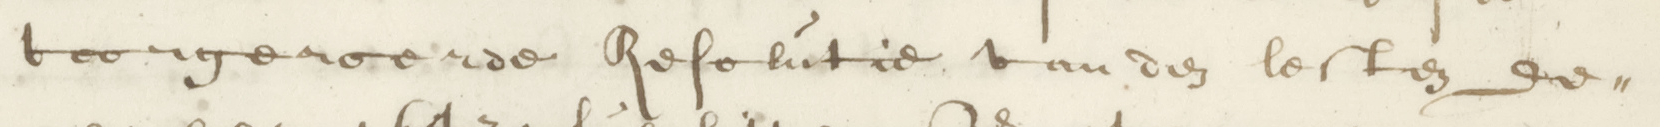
voorgeroerde Resolutie van den lesten de„
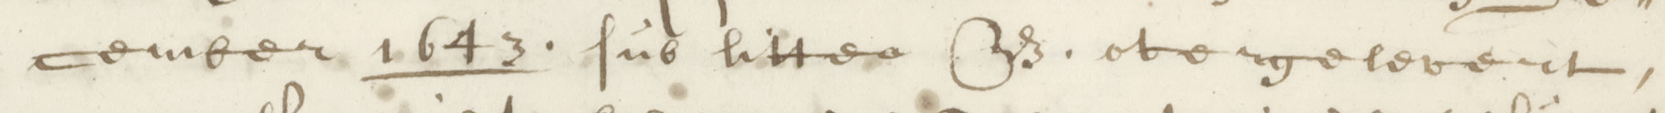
cember 1643. sub littea B. overgelevert.
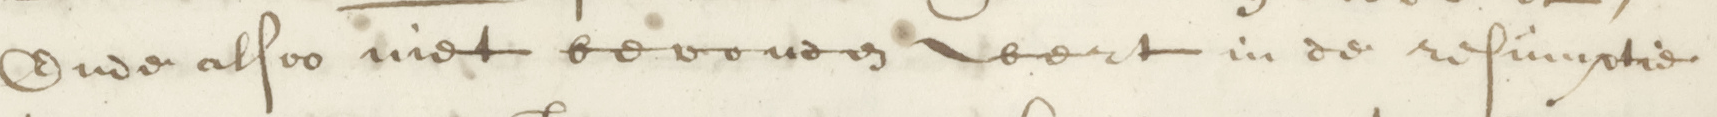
Ende alsoo niet bevonden wert in de resumptie
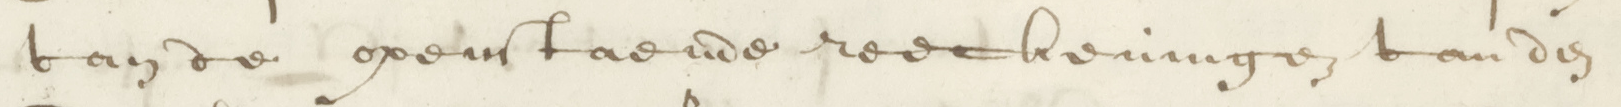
van de openstaende reeckeningen van den
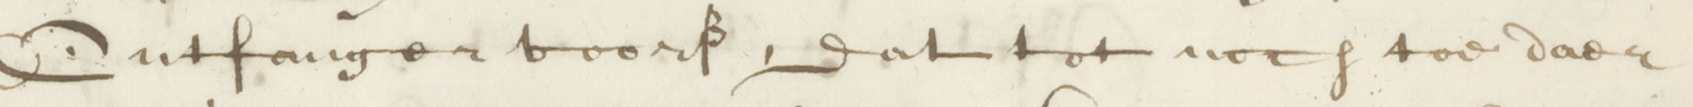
Ontfanger voors, Dat tot noch toe daer
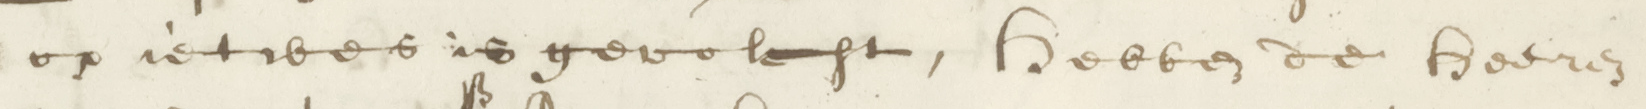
op ietwes is gevolcht, Hebben de Heeren
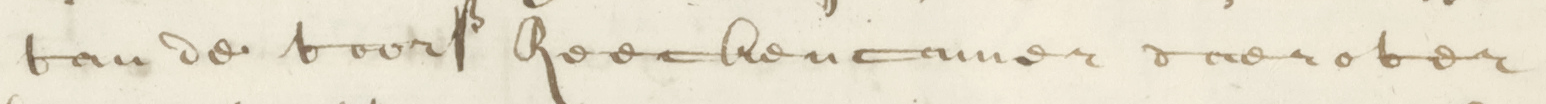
van de voors Reeckencamer daerover
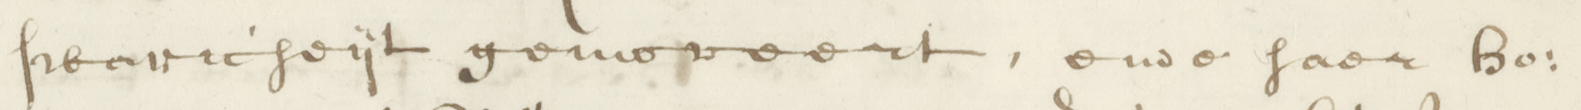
swaricheijt gemoveert, ende haer Ho:
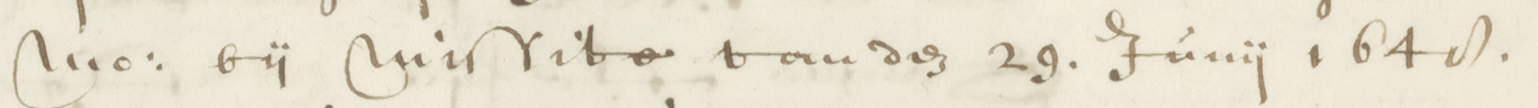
Mo: bij missive van den 29. Junij 1648.
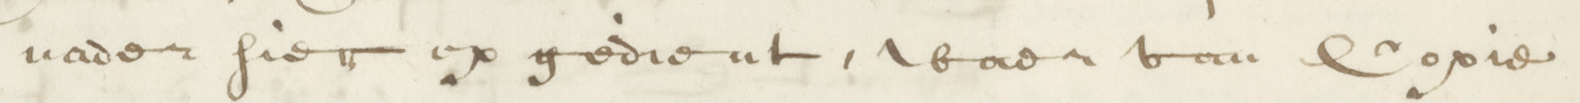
nader hier op gedient, Waer van Copie
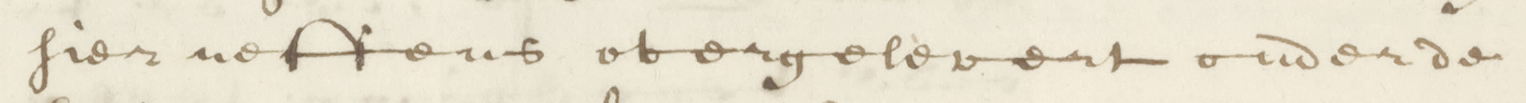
hier neffens overgelevert onder de
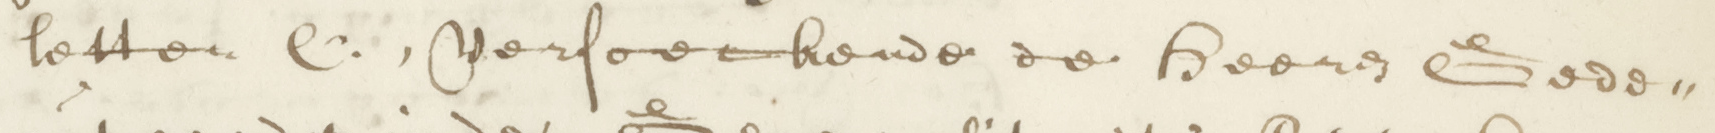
letter C., versoeckende de Heeren Gede„
